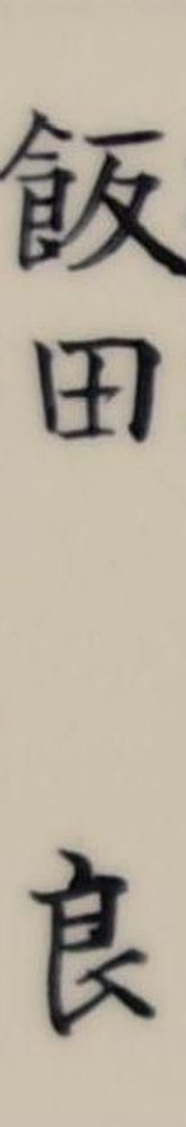飯田良
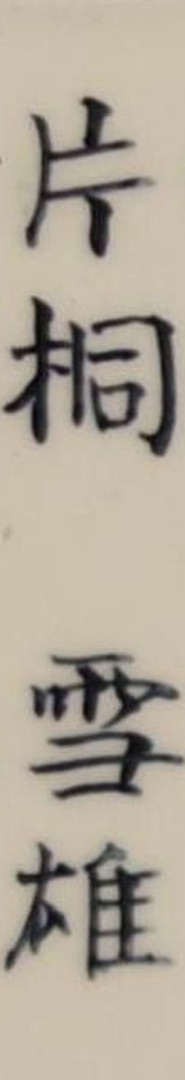片桐雪雄
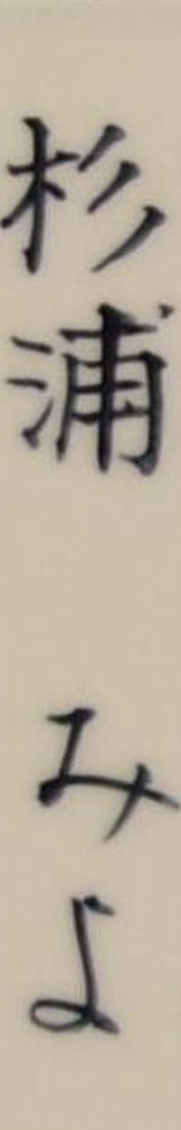杉浦みよ
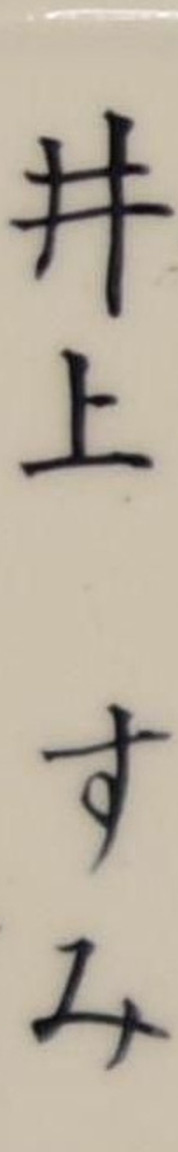井上すみ
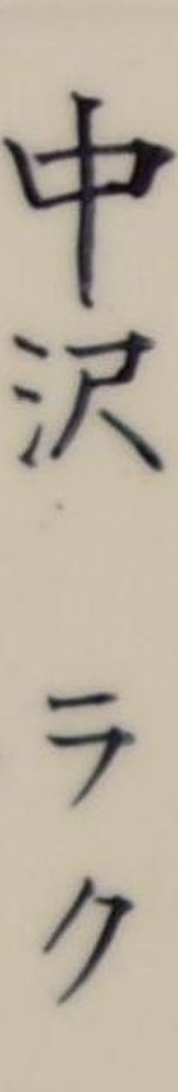中沢ラク
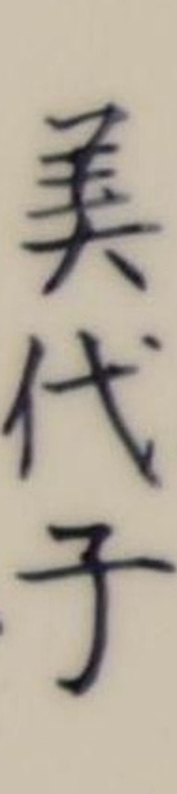美代子
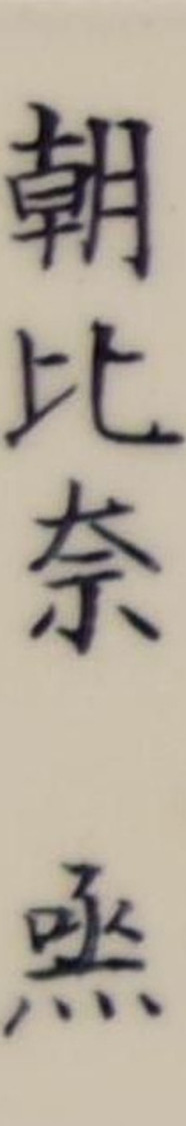朝比奈丞
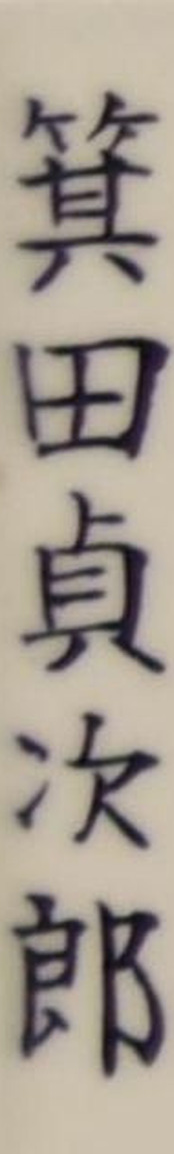箕田貞次郎

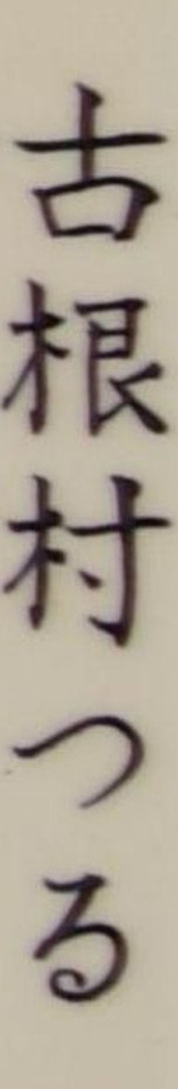古根村つる
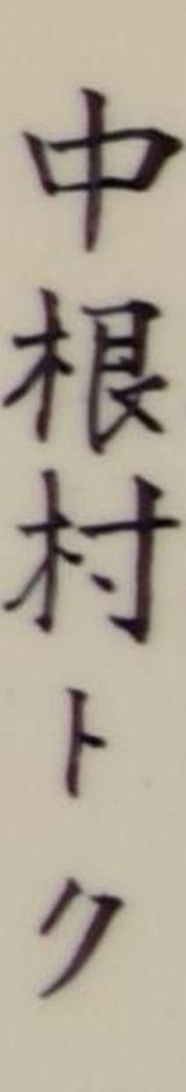中根村トク
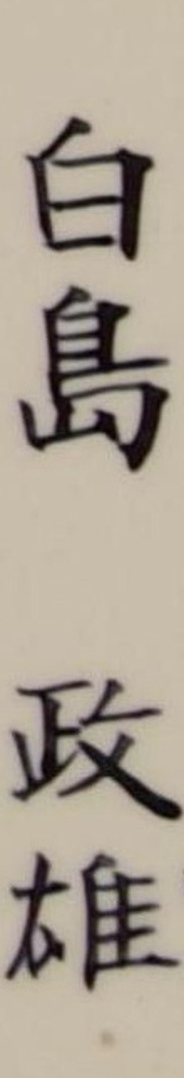白島政雄
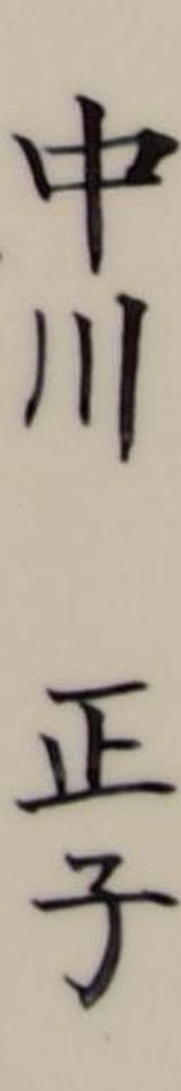中川正子
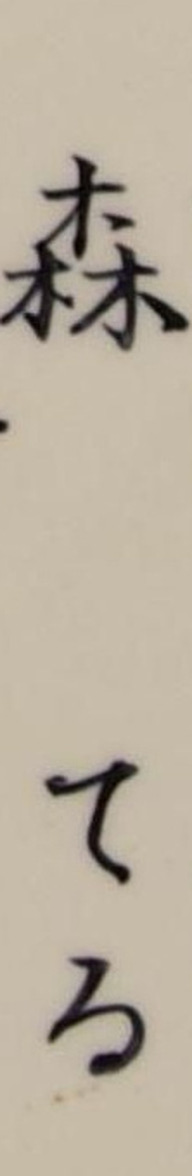森てる
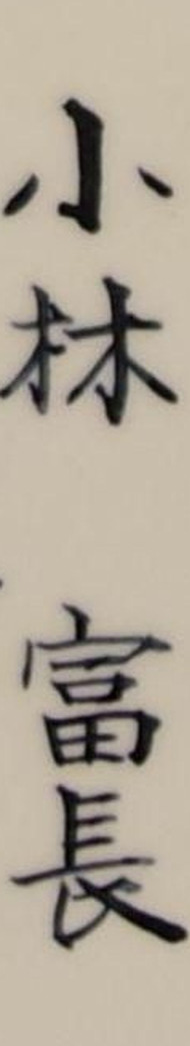小林富長
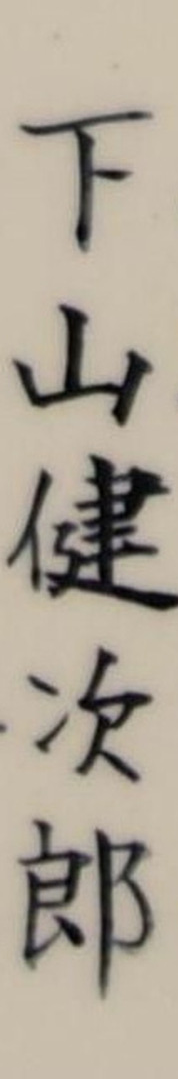下山健次郎
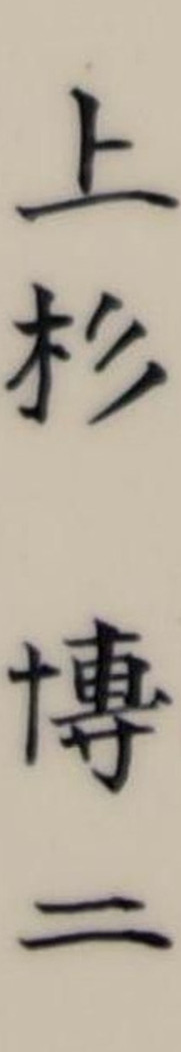上杉博二
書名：M~S
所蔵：高野山金剛峯寺
